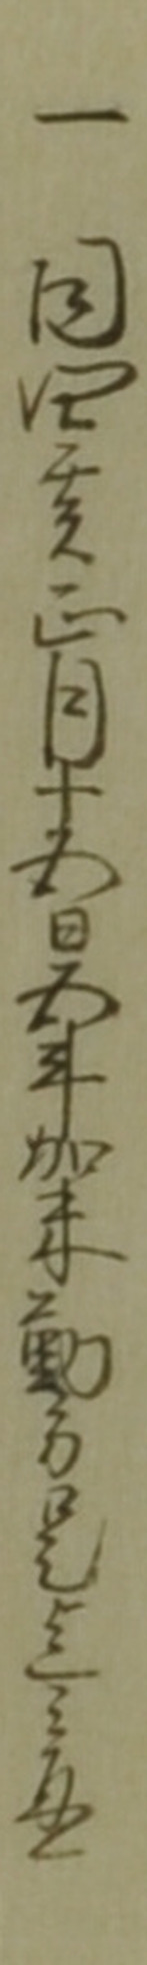一同四亥正月十五日五斗加米勤方是迄之通

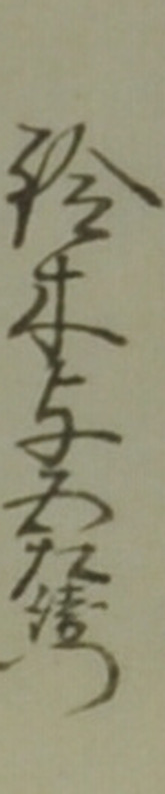鈴木与五左衛門
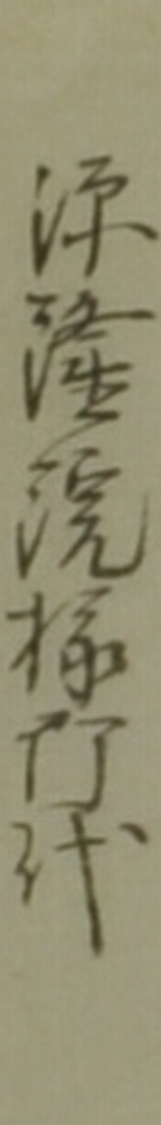源隆院様御代
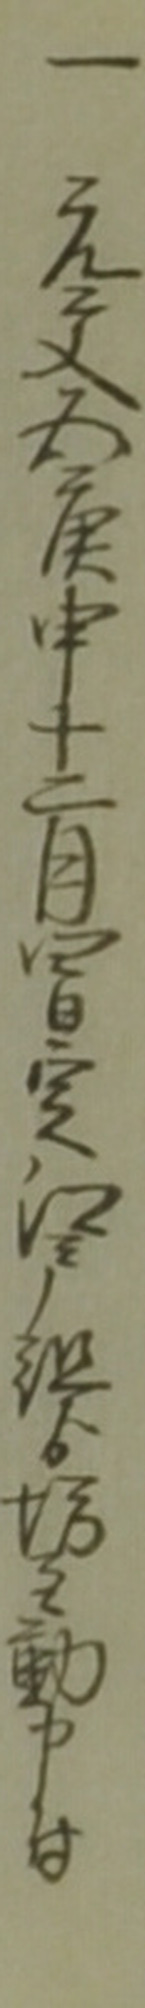一元文五庚申十二月四日定江戸組ゟ坊主勤申付
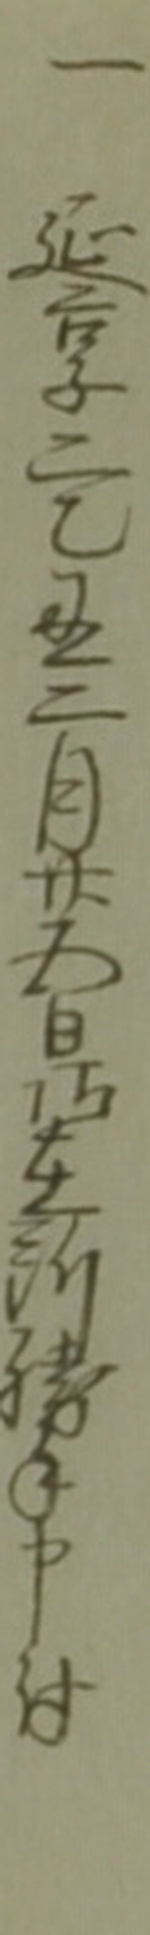一延享二乙丑二月廿五日御在所勝手申付
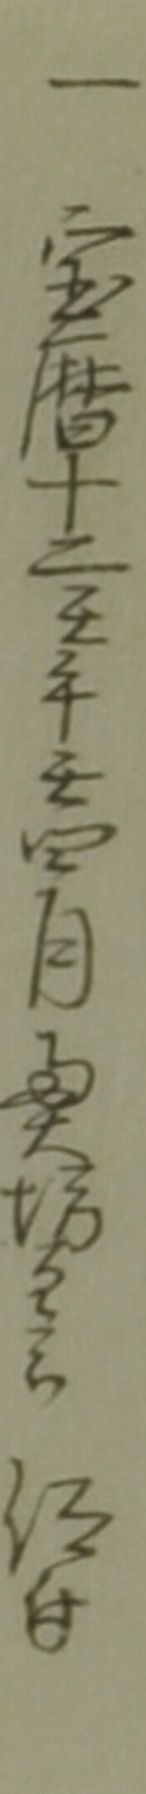一宝暦十二壬午閏四月奥坊主被仰付
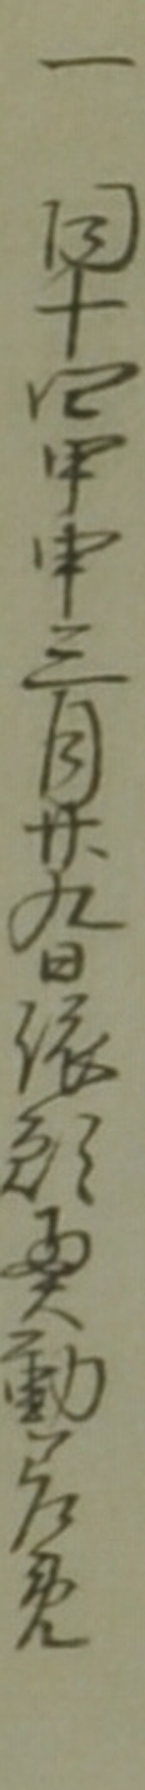一同十四甲申三月廿九日依願奥勤差免
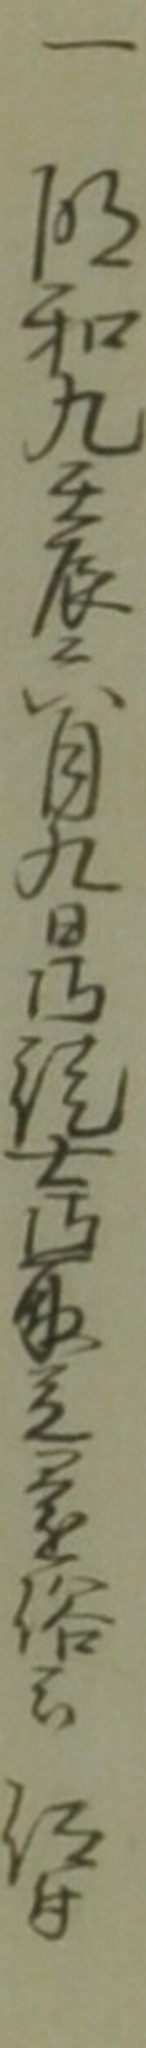一明和九壬辰六月九日御徒士御取立還俗被仰付
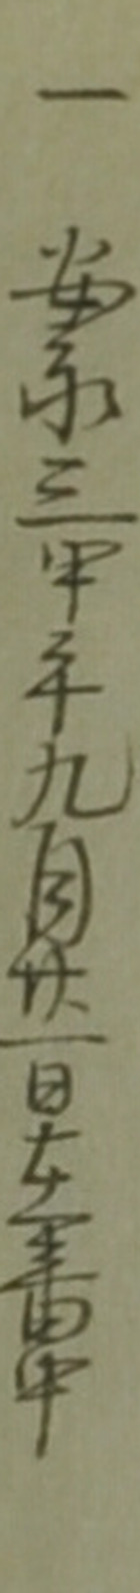一安永三甲午九月廿一日在番中
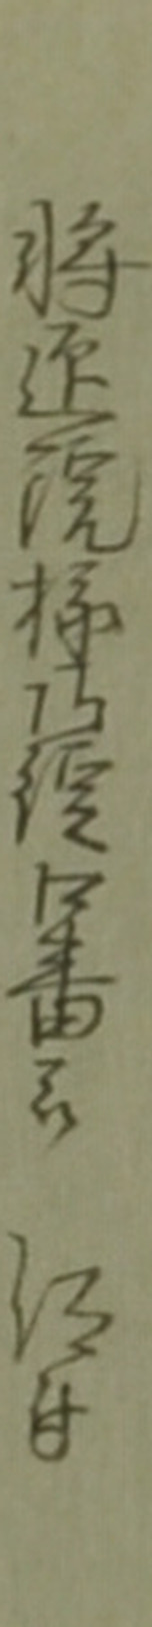将迎院様御錠口番被仰付
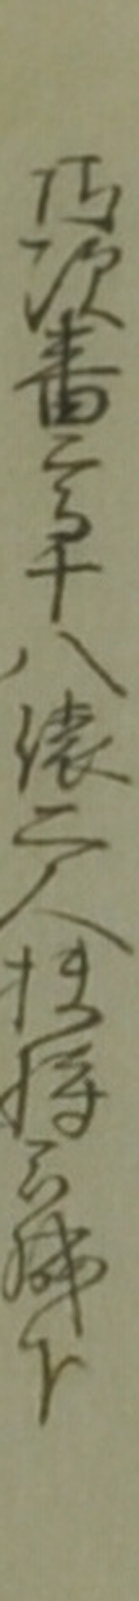御次番高十八俵二人扶持被成下
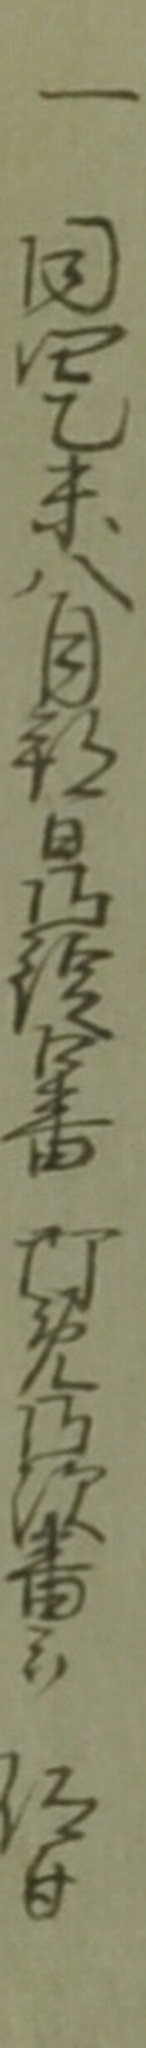一同四乙未八月朔日御錠口番御免御次番被仰付
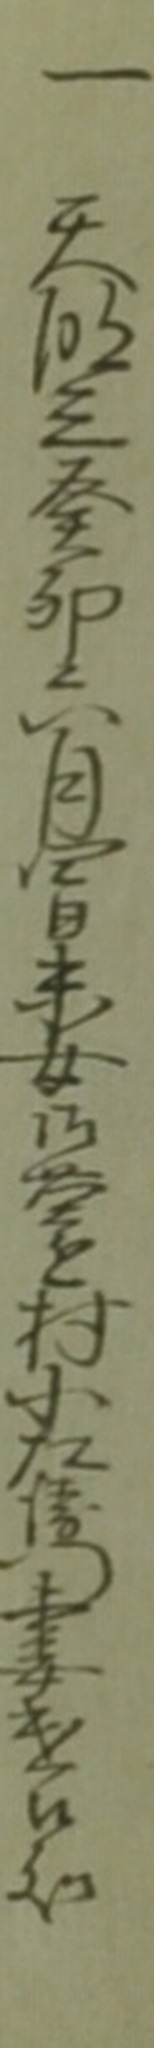一天明三癸卯六月四日末女御薗村小左衛門妻遣候処

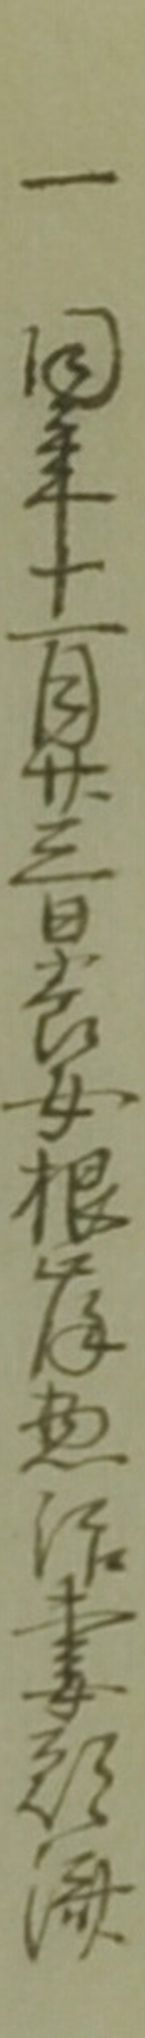一同年十一月廿三日養女根岸惣治妻願済
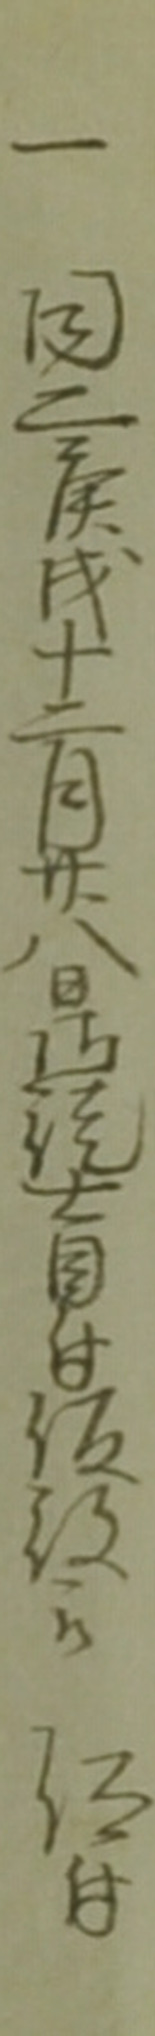一同二庚戌十二月廿八日御徒士目付仮役被仰付
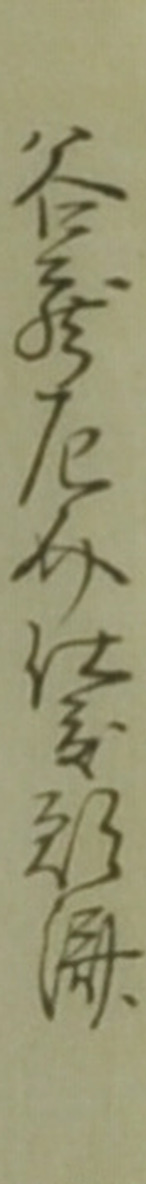谷蔵厄介仕度願済
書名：無足諸士勤仕録（九）
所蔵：伊那市立高遠町図書館・合同会社AMANE
